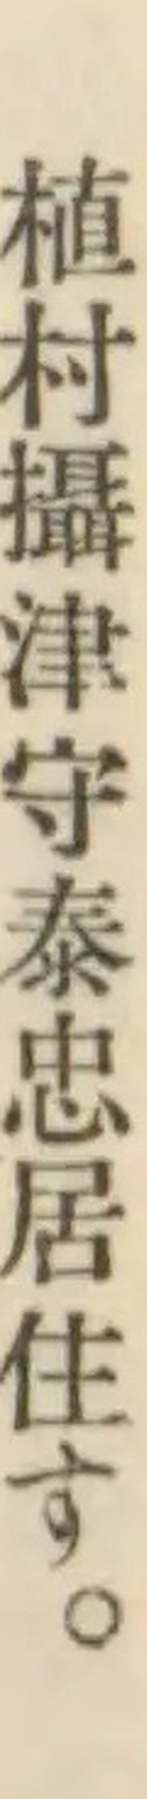植村摂津守泰忠居住す。
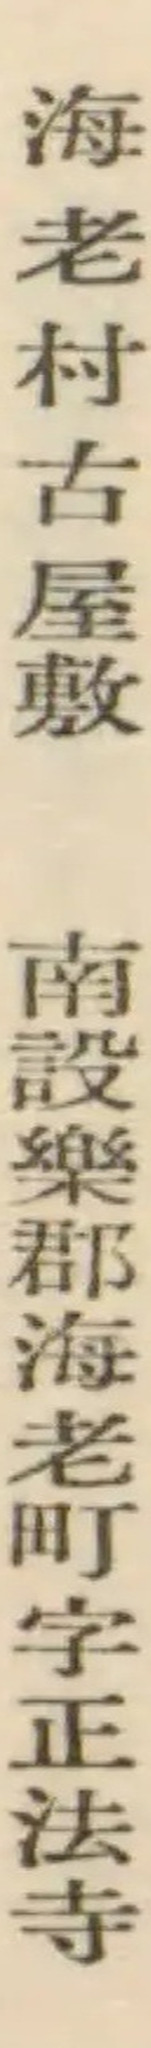海老村古屋敷南設楽郡海老町字正法寺
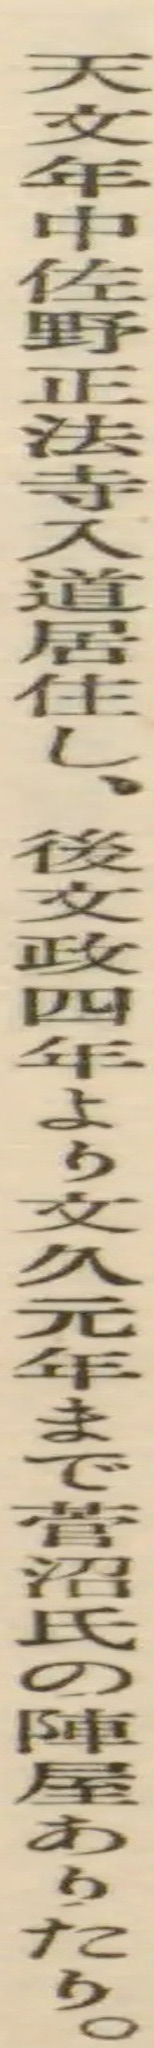天文年中佐野正法寺入道居住し、後文政四年より文久元年まで菅沼氏の陣屋ありたり。
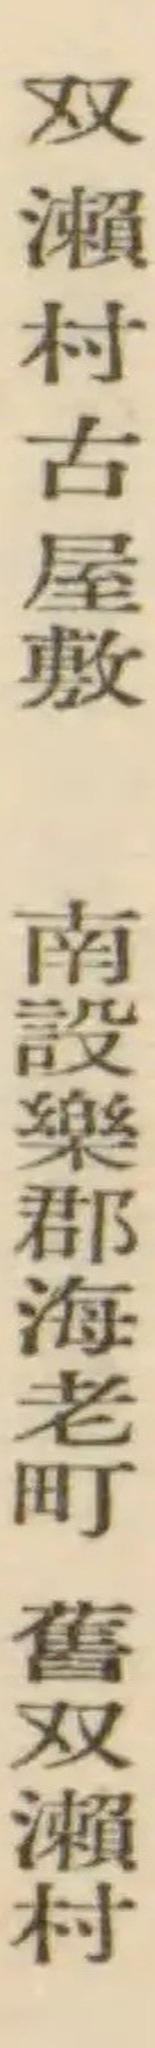双瀬村古屋敷南設楽郡海老町旧双瀬村

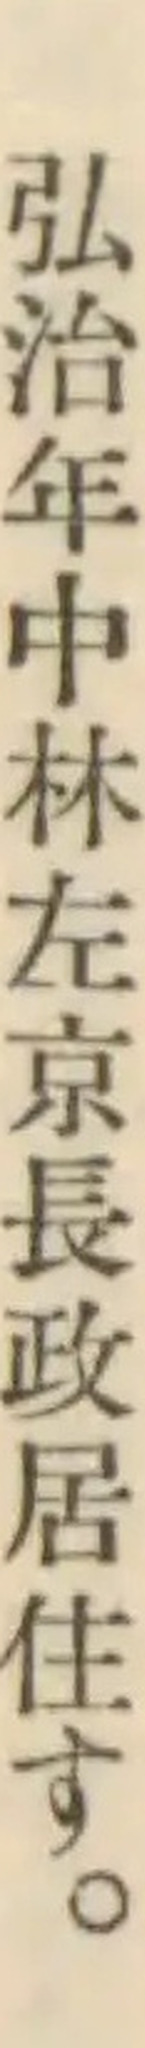弘治年中林左京長政居住す。
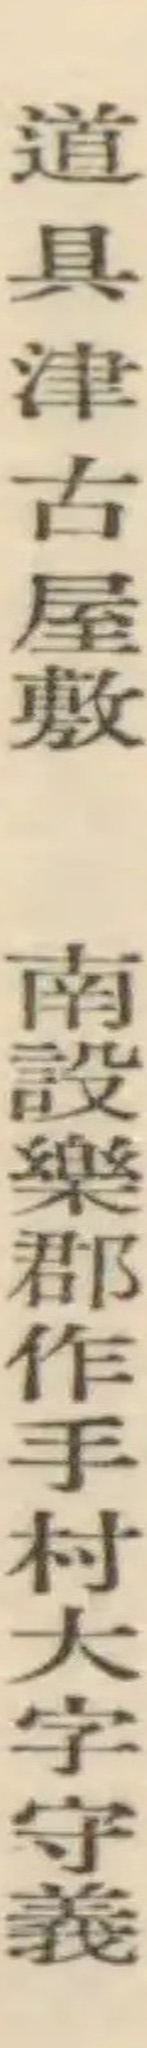道具津古屋敷南設楽郡作手村大字守義
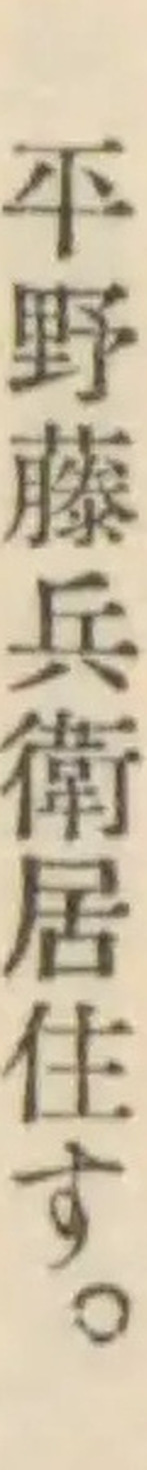平野藤兵衛居住す。
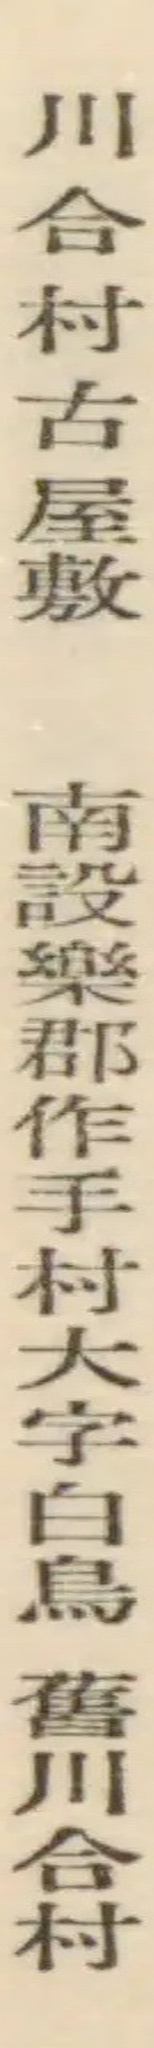川合村古屋敷南設楽郡作手村大字白鳥旧川合村
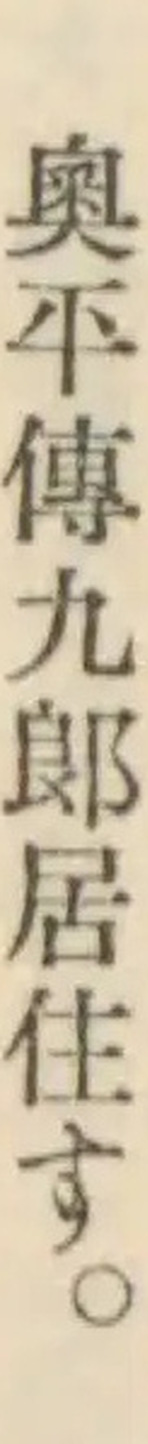奥平伝九郎居住す。
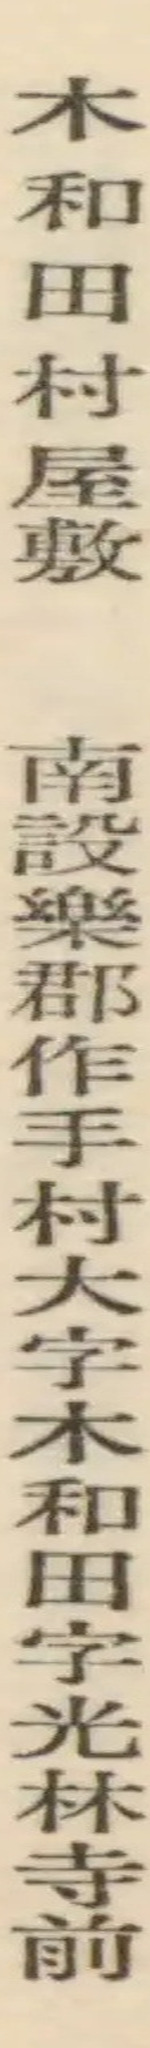木和田村屋敷南設楽郡作手村大字木和田字光林寺前
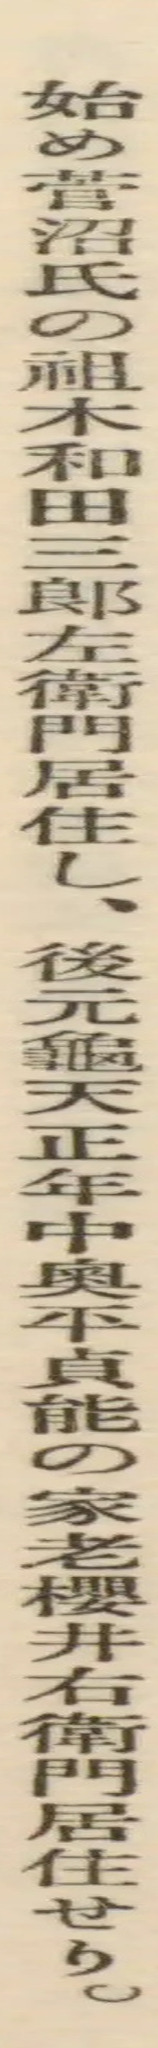始め菅沼氏の祖木和田三郎左衛門居住し、後元亀天正年中奥平貞能の家老桜井右衛門居住せり。
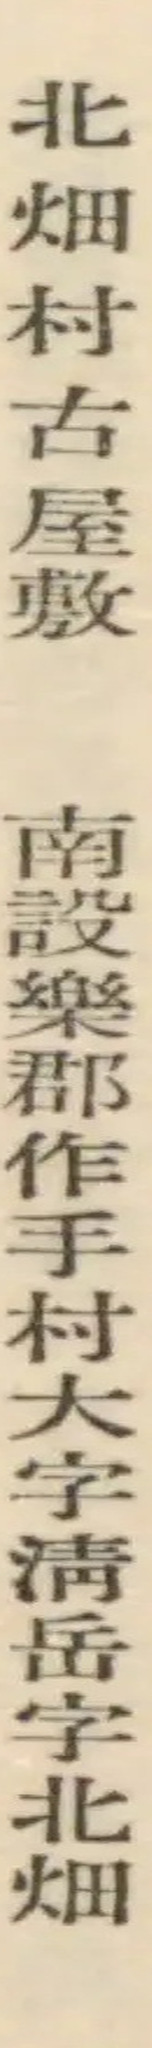北畑村屋敷南設楽郡作手村大字清岳字北畑
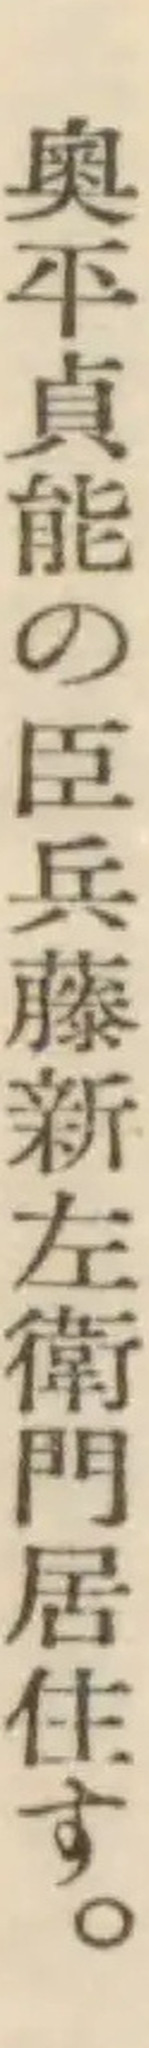奥平貞能の臣兵藤新左衛門居住す。
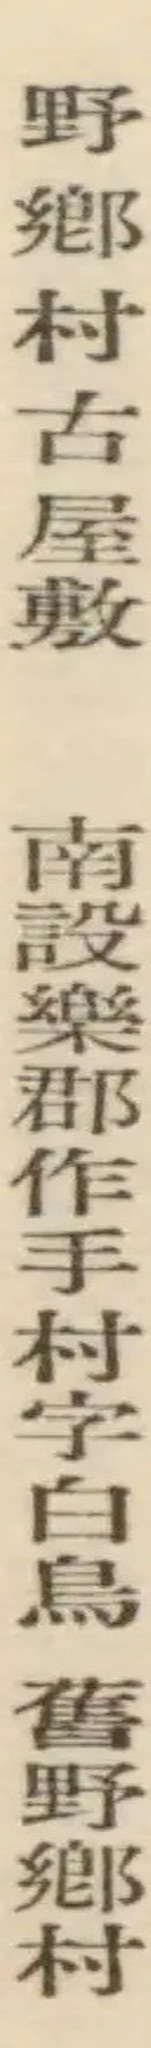野郷村古屋敷南設楽郡作手村字白鳥旧野郷村
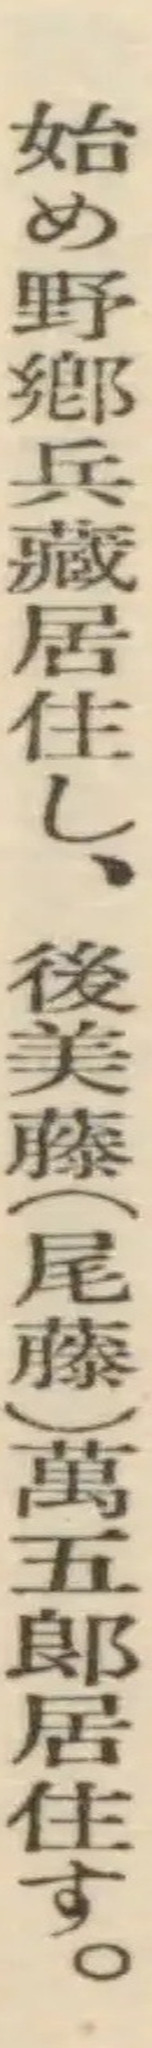始め野郷兵蔵居住し、後美藤(尾藤)萬五郎居住す。
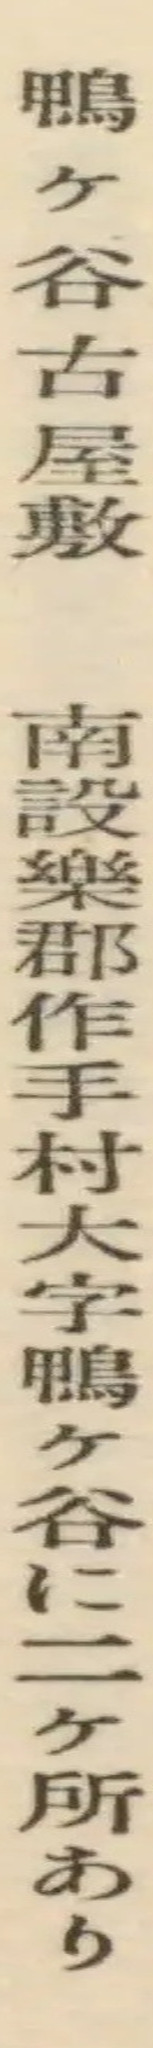鴨ケ谷古屋敷南設楽郡作手村大字鴨ケ谷に二ケ所あり
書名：東三河之古城
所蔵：国立国会図書館 National Diet Library, JAPAN
